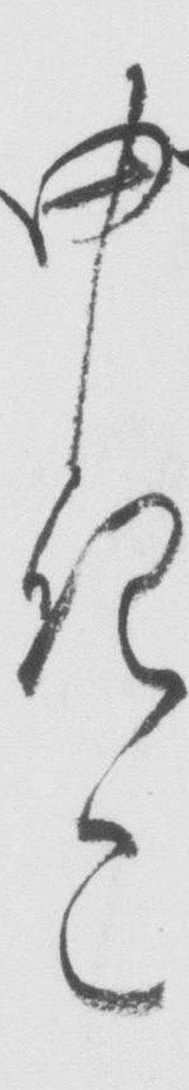ゆきこ
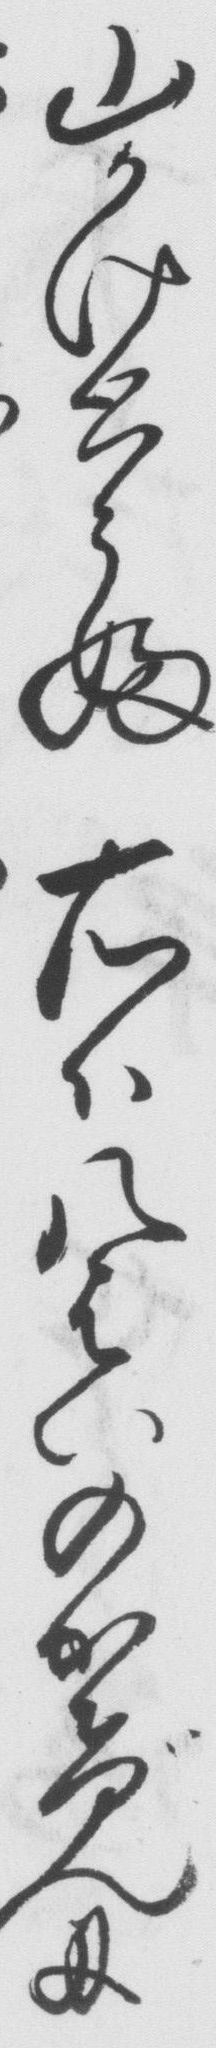坪山かけとうふ右は八はいのかへんに
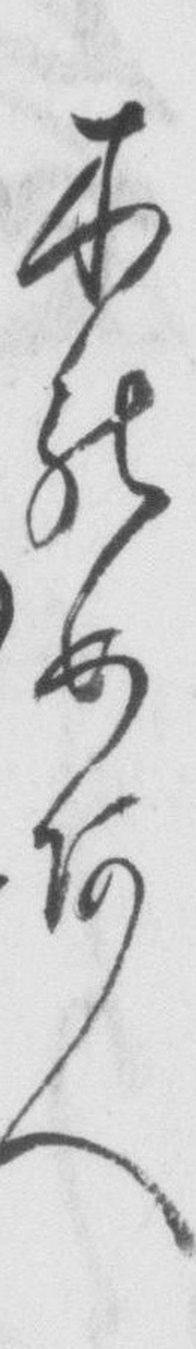木のめあへ

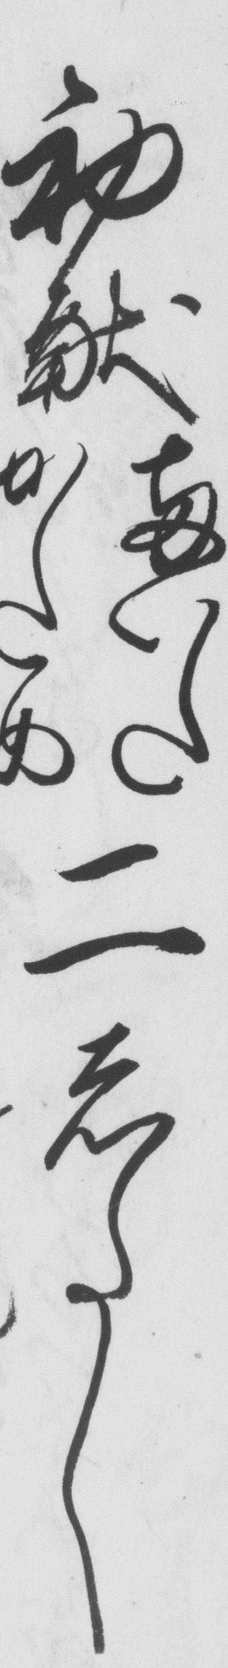初献いたニしたし
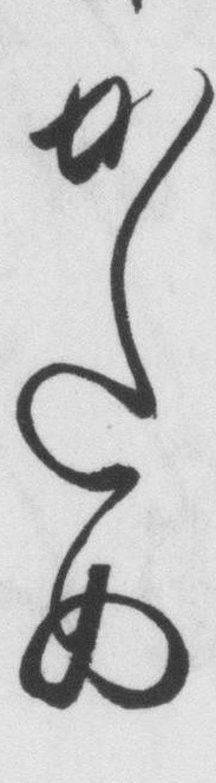かため
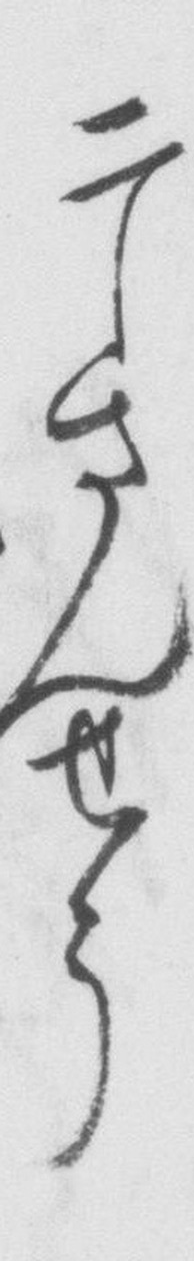干さんせう
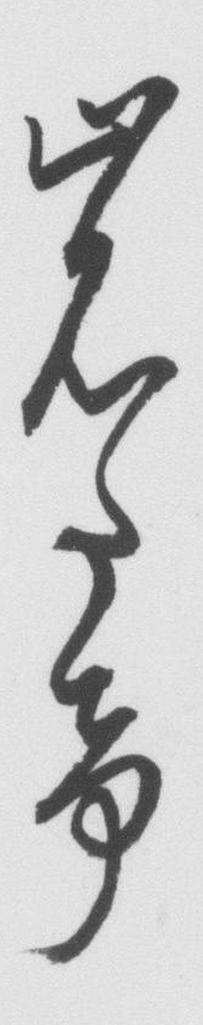岩たけ
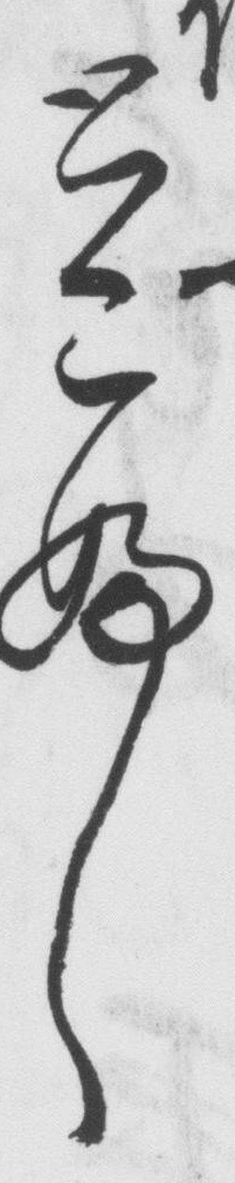とこぶし
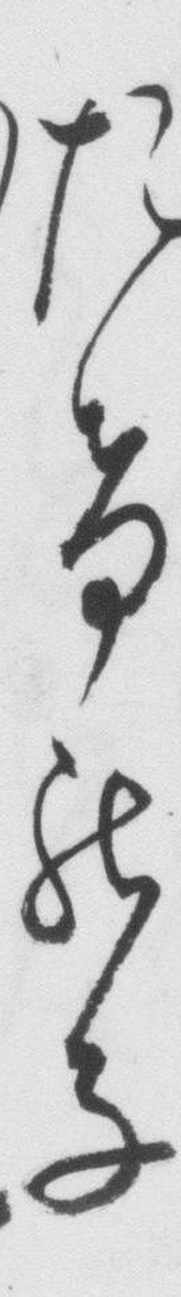たけの子
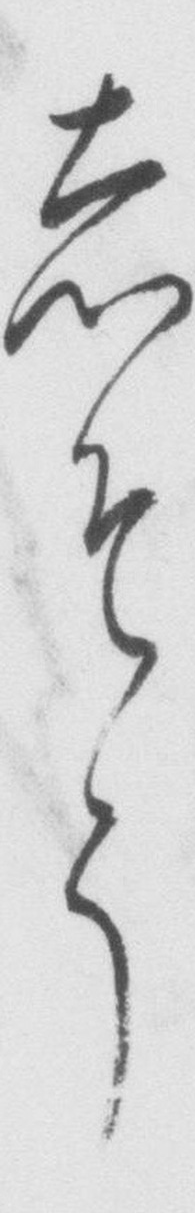ゑそう
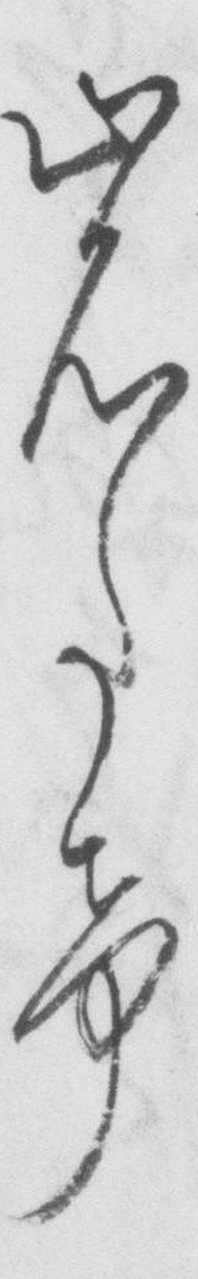岩たけ

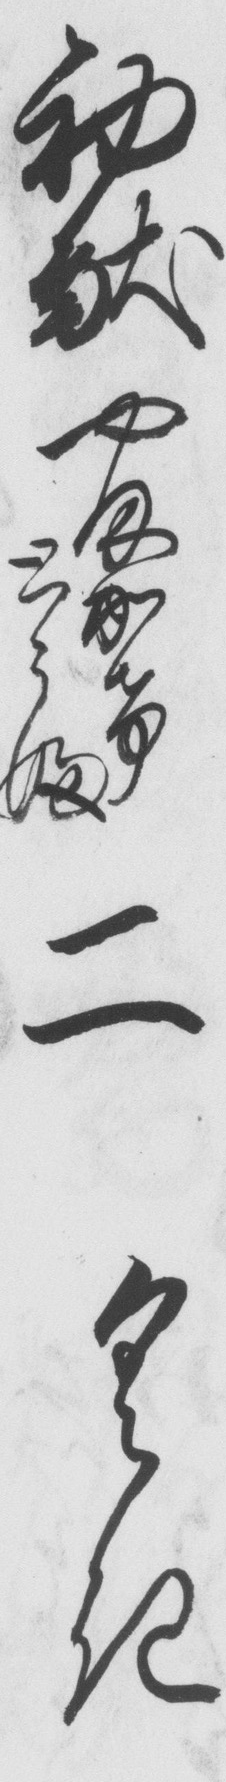初献やまかけ二ゝき
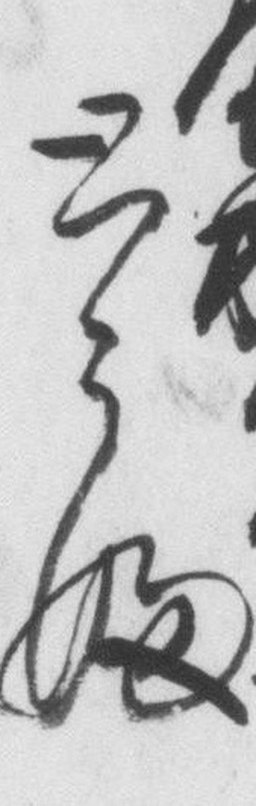とうふ
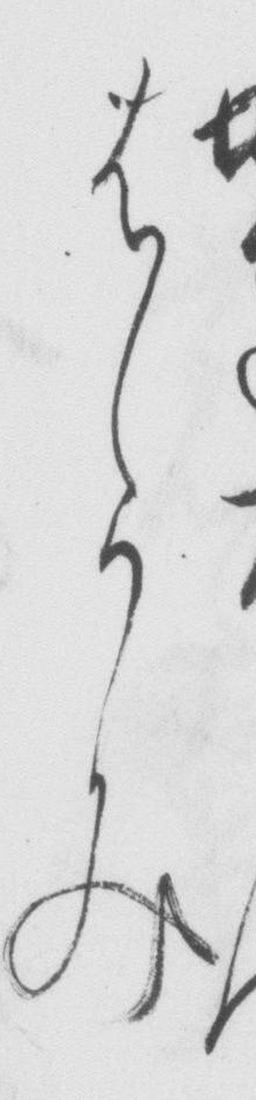はしか汁
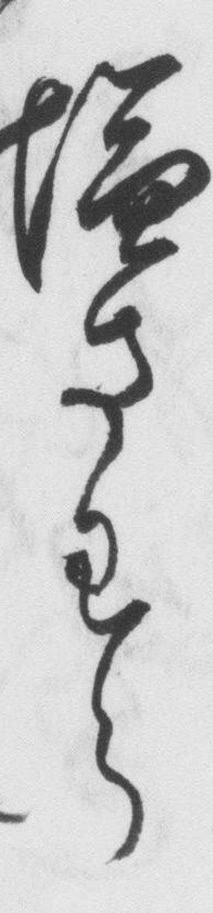塩さわら
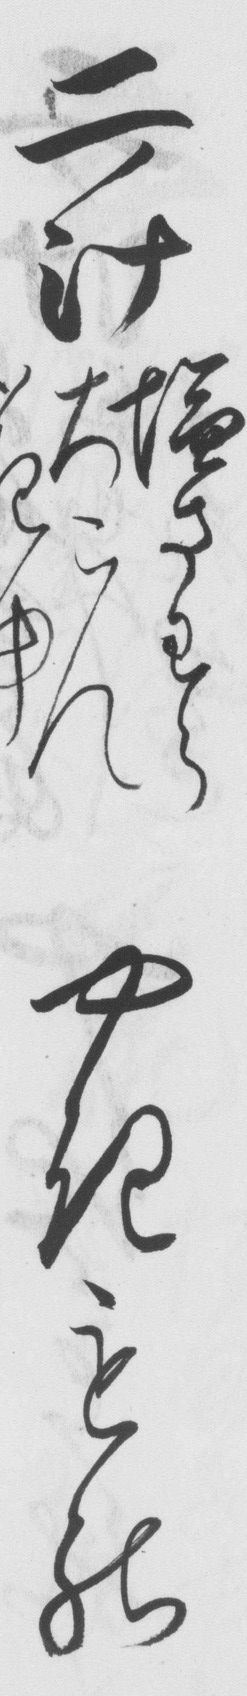二ノ汁大こんやきもの
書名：料理筌
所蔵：大阪府立大学学術情報センター 国文学研究資料館
